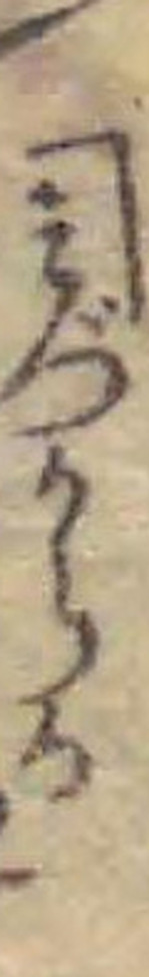〽みづからが
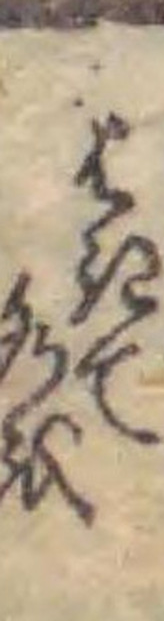はきて
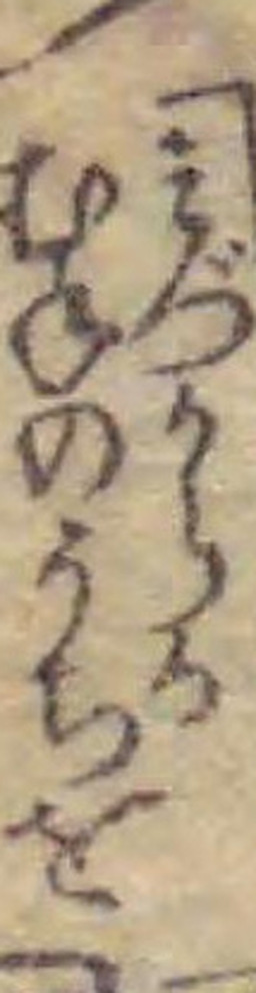むねのうちを
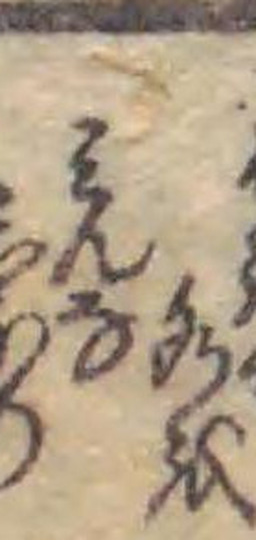みんな
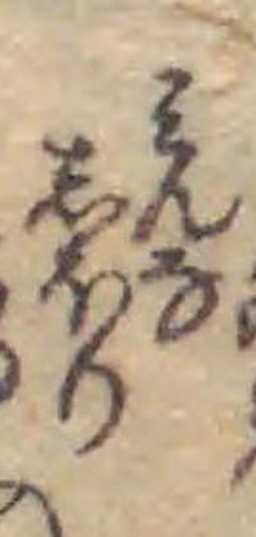しほり
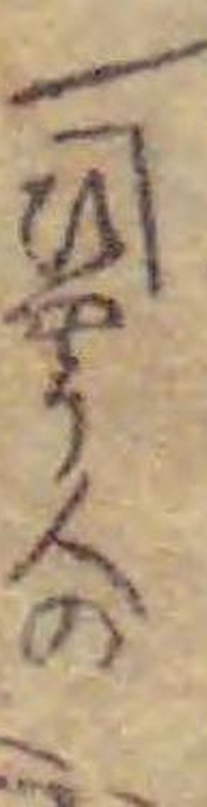〽ひやう人の
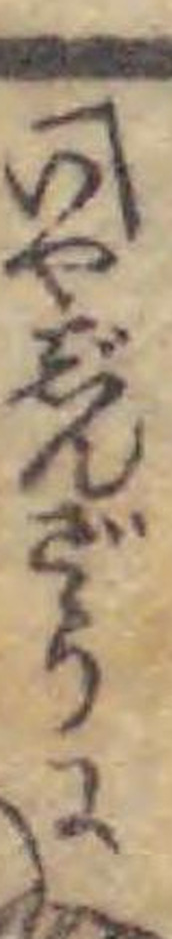〽いやじんざうに
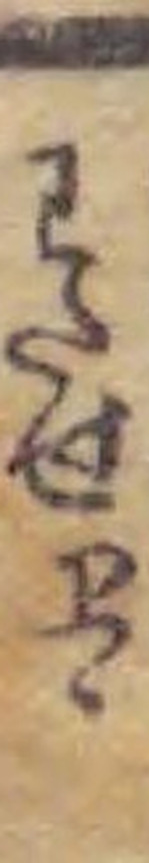わたせヱゝ
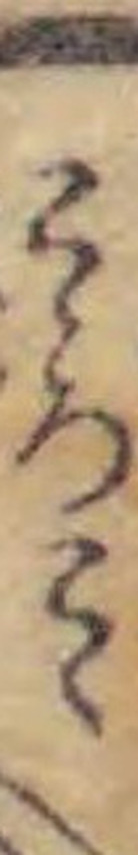こゝろこゝ
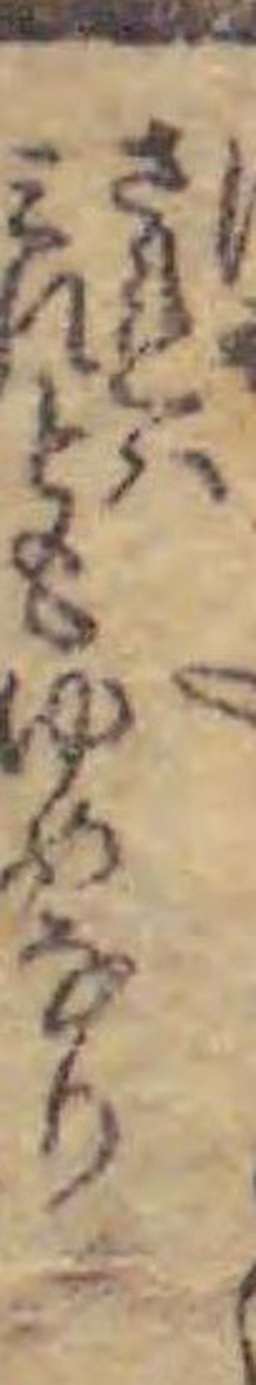みれともゆめなり
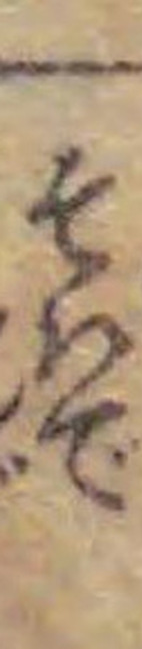そはで
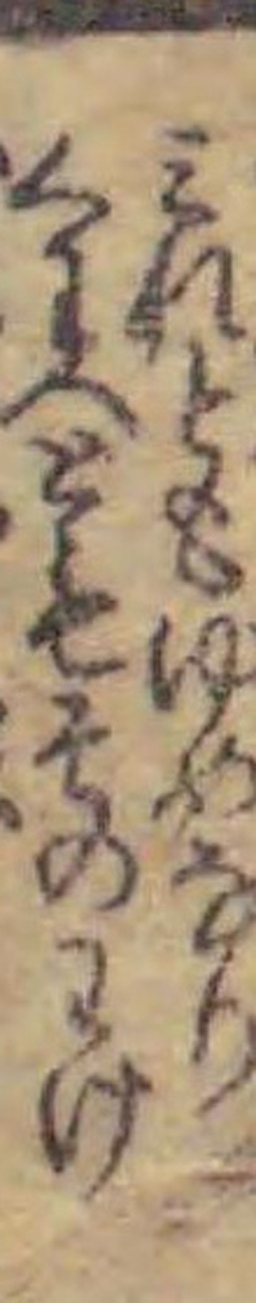くわへともそのわけ
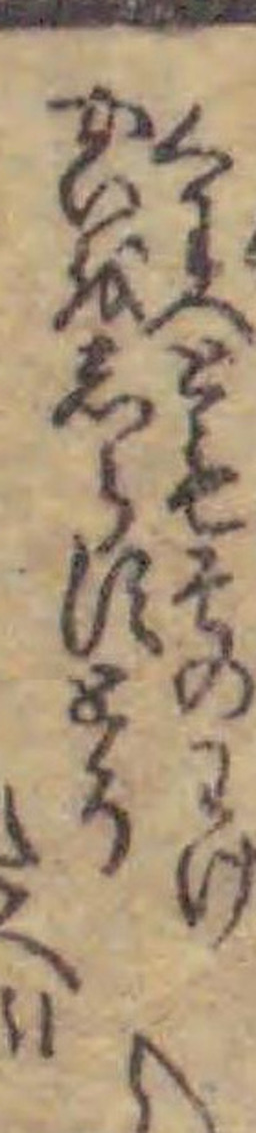やいをしらすとう
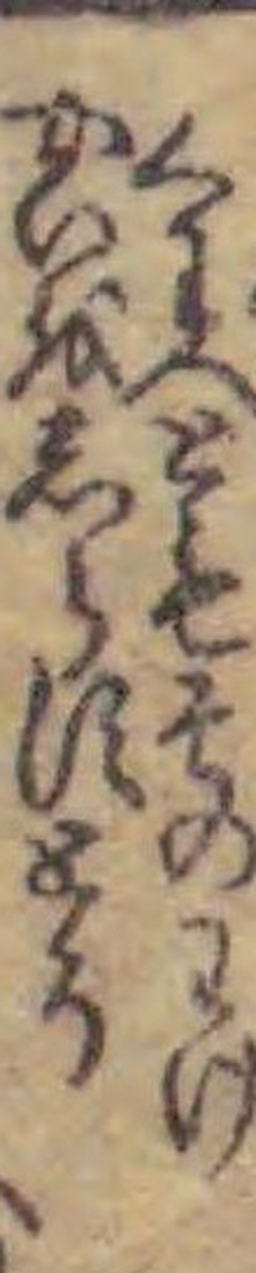やいをしらすとう
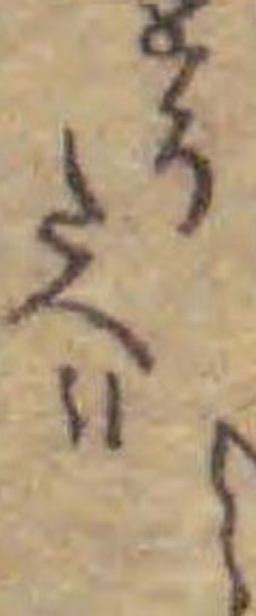たへり
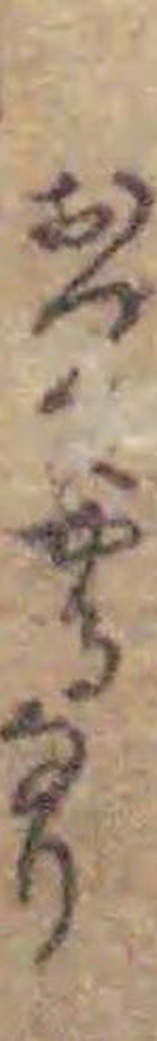おつてやるなり
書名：十四傾城腹之内 : 3巻
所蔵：国立国会図書館 National Diet Library, JAPAN
